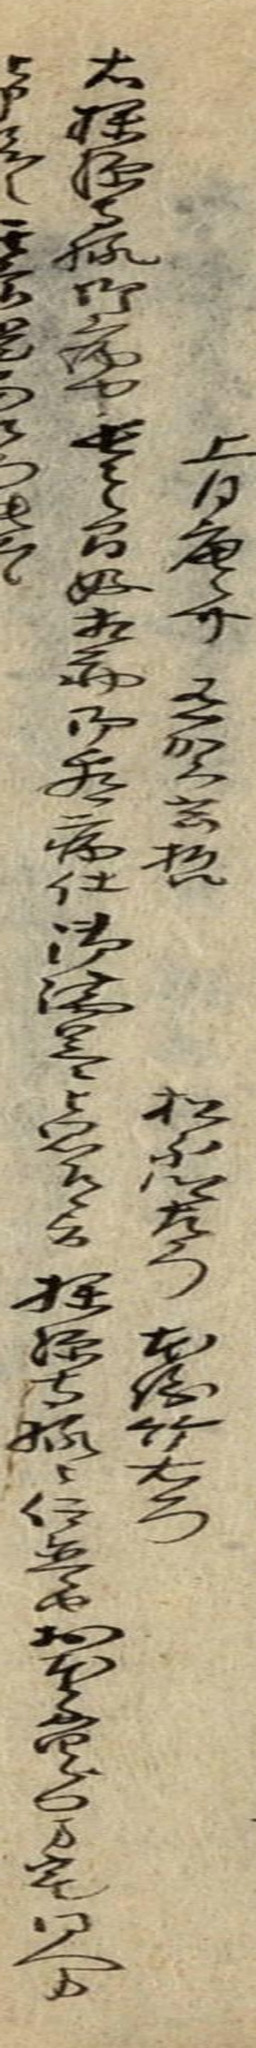右探源寺様御病中長々之間好相勤御看病仕御満足に被思召候旨探源寺様被仰置候由於本多四郎右衛門方宅同人方
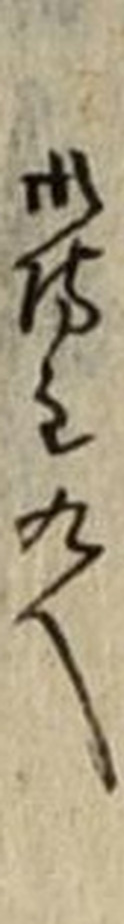御坊主九人
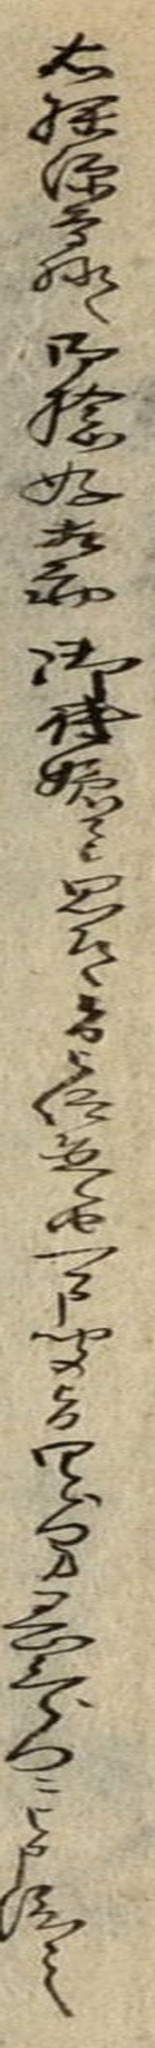右探源寺様へ御捻好相勤御機嫌に被思召候旨被仰置候由可申聞旨四郎右衛門方岡三郎右衛門に被申渡之
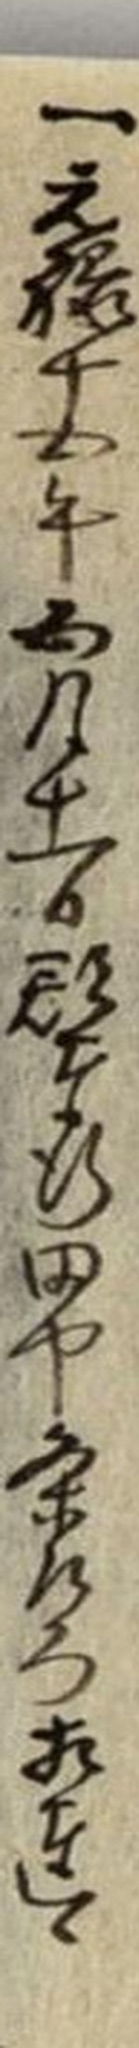一元禄十五午五月十一日郡奉行田中条左衛門相達候
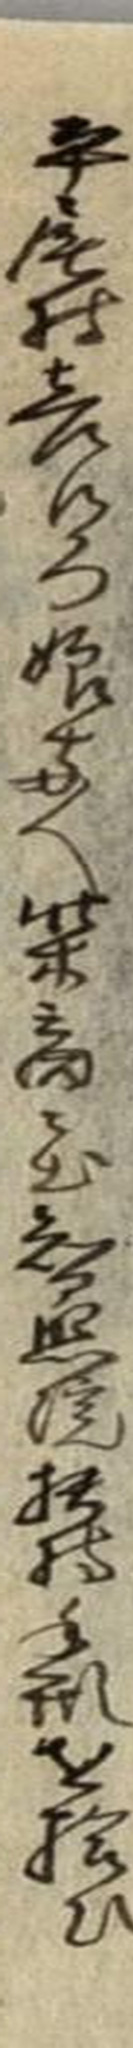平尾村彦左衛門娘両人柴商に出智照院扶持手形を拾ひ
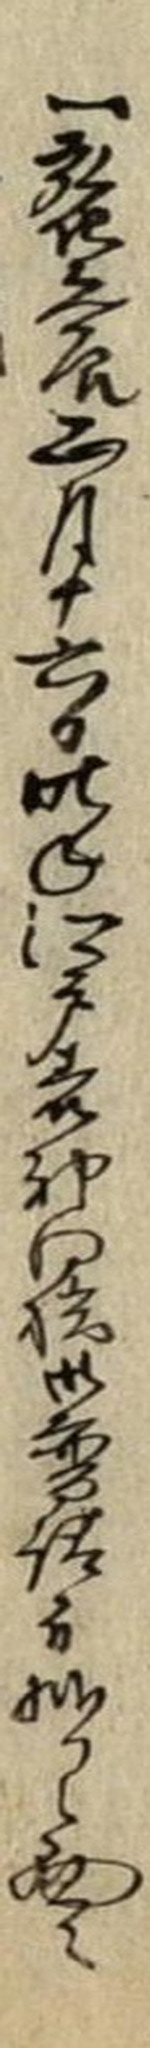一弘化元辰正月十六日昨年江戸表神田橋御普請ニ付掛り之面々
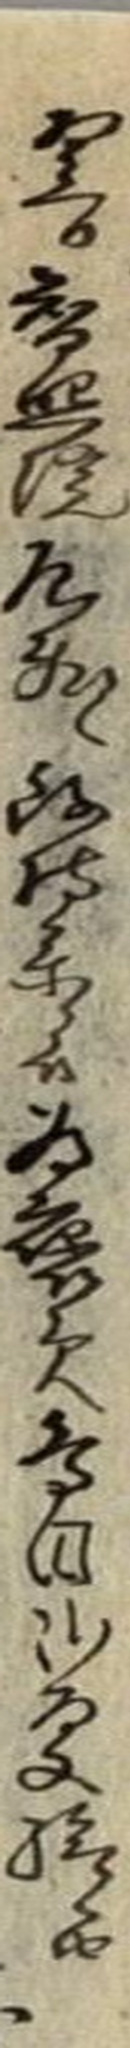翌日智照院屋敷へ致持参候に付為褒美鳥目弐百文給候由
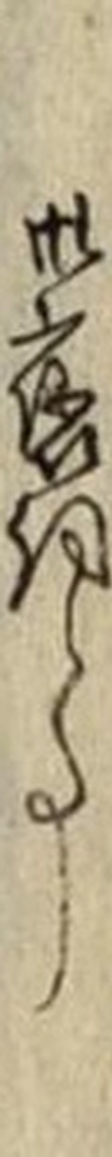御褒詞之事
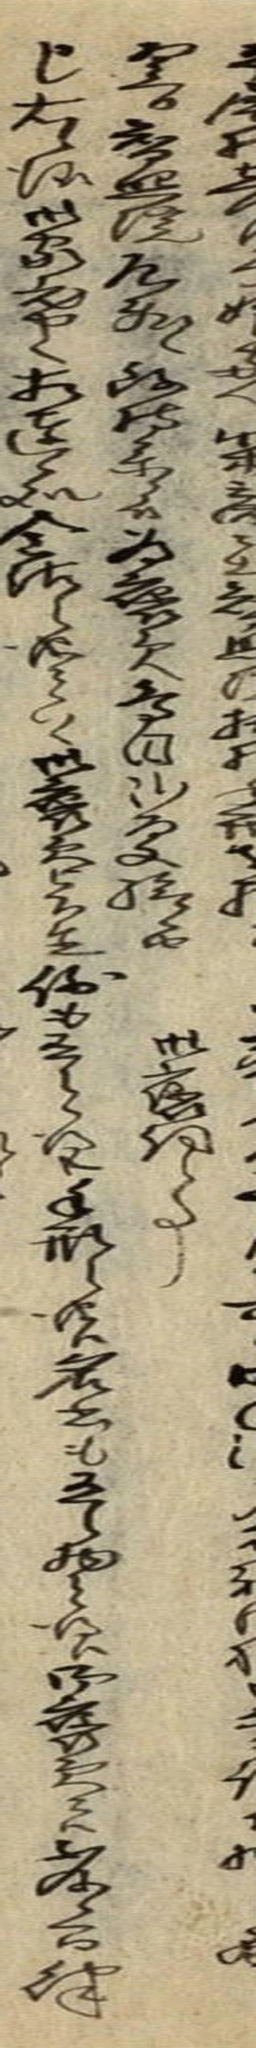申候右之趣御家老中へ相達候処金銀之儀に候はゝ御褒美被下置儀も有之候得共手形之儀は名書も有之物に候得は御褒美には不及候間律
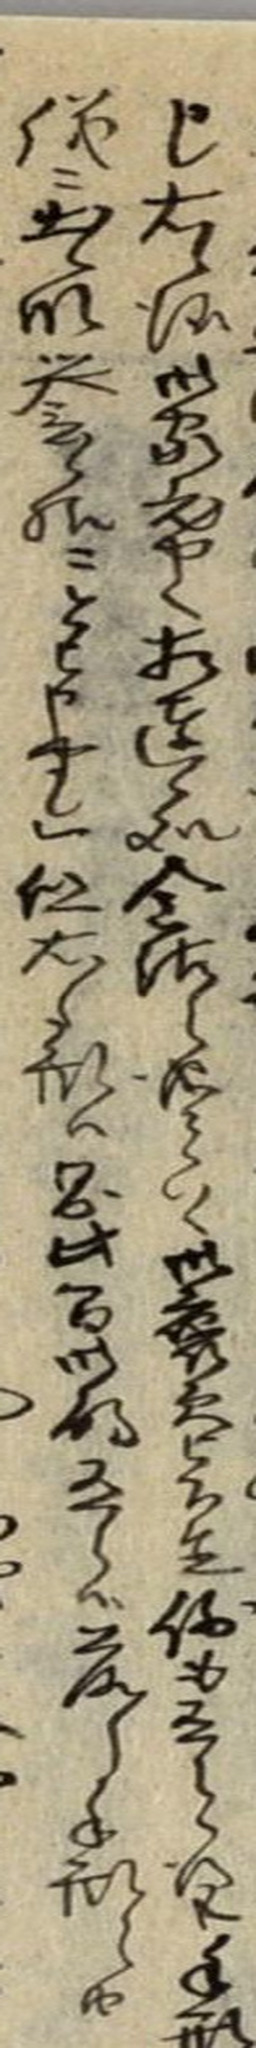儀に出候段誉候様にと被申聞候」但右之手形は則此間御触有之候落し候手形之由
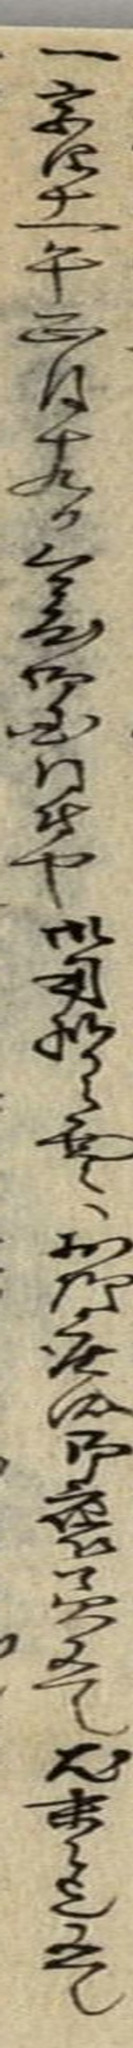一享保十一午正月十九日今度御国目付中御用掛り之面々へ於御座所御褒美有之尤未々迄有之
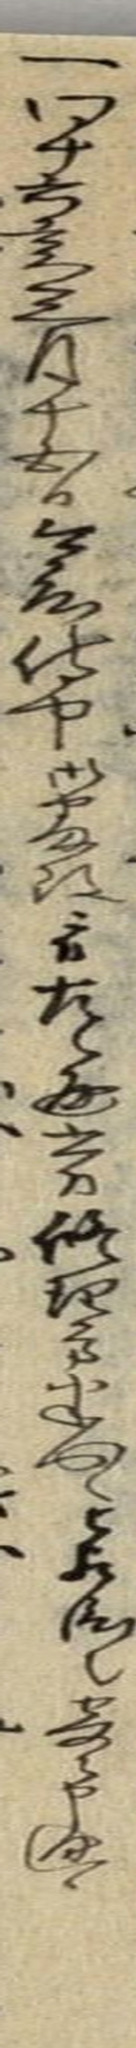一同十六亥三月十五日今度侍中御番改に付左之通書付修理方半右衛門へ被相渡之寄々申通候
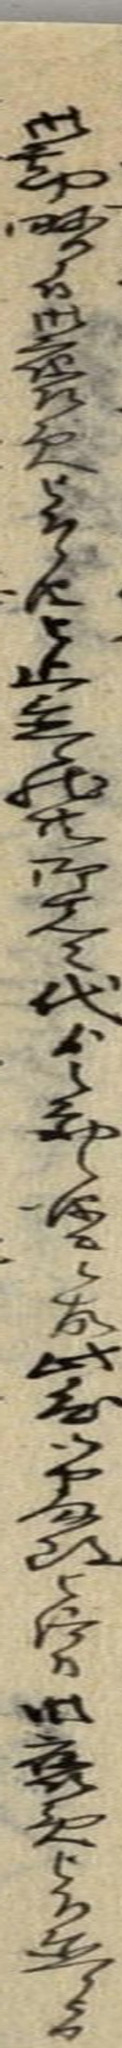御勘略に付御褒美被下候儀被止置候然共御先々代ゟ之勤之儀に候故此度御番改被仰付御褒美被下置旨
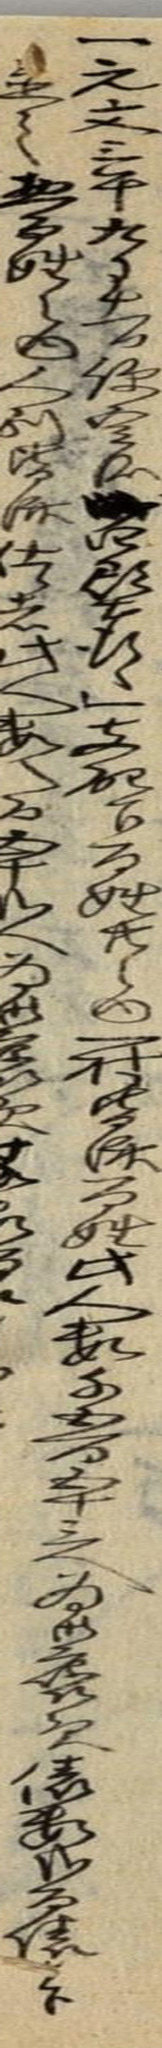一元文三午九月十一日評定所四郡奉行へ」支配下百姓共之内一村皆済百姓此人数千五百五十三人為御褒美俵数弐百俵被下
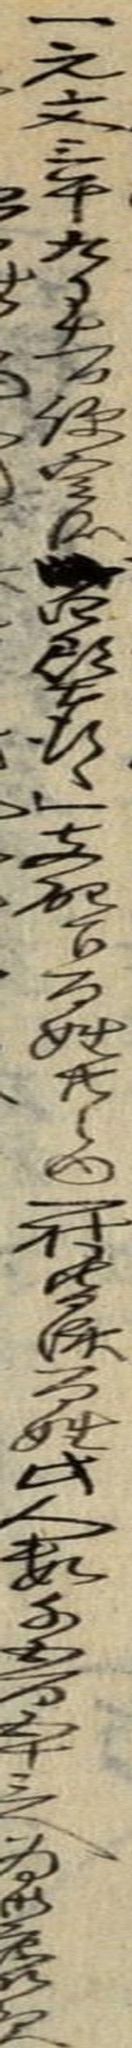一元文三午九月十一日評定所四郡奉行へ」支配下百姓共之内一村皆済百姓此人数千五百五十三人為御褒美俵数弐百俵被下
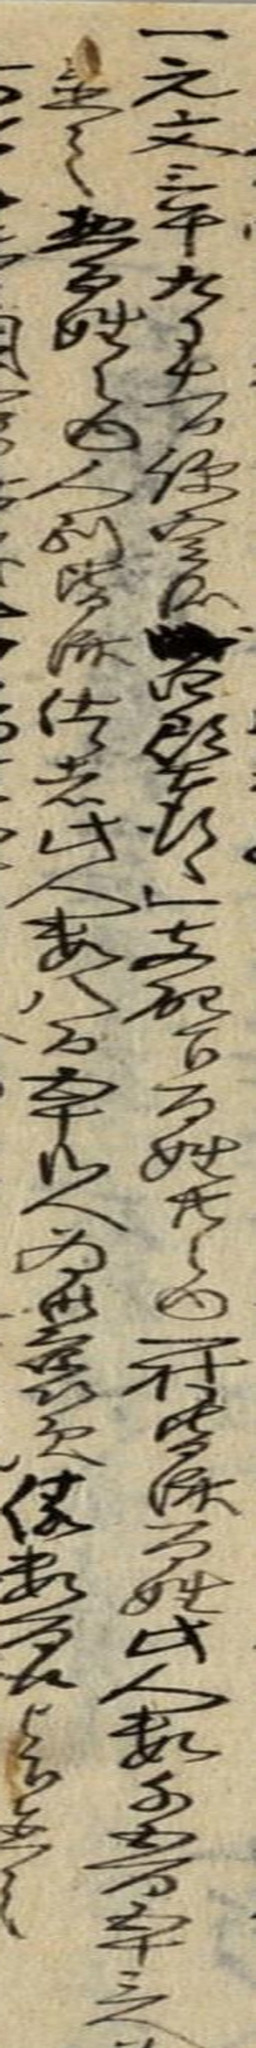置之惣百姓之内人別皆済仕候者此人数八百五十弐人為御褒美俵数百俵被下置之
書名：御用并被仰出之部
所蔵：福井県文書館 Fukui Prefectural Archives
